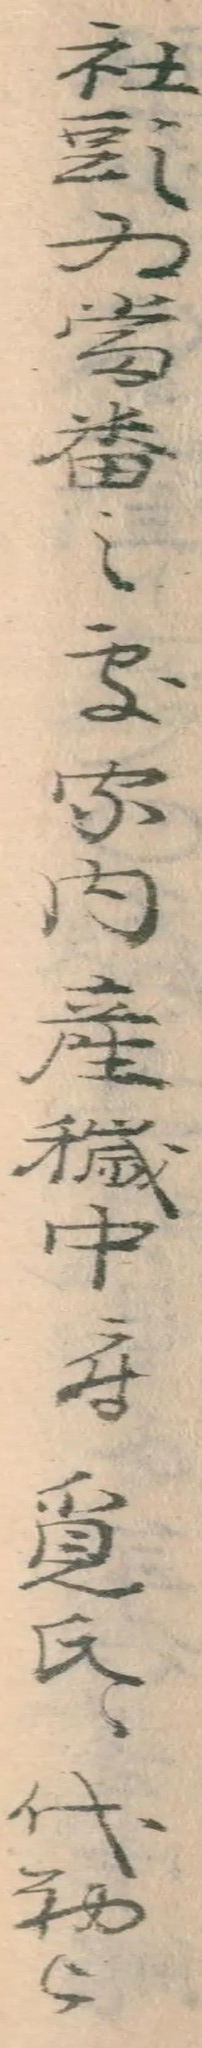社頭為當番之處家内産穢中ニ付覚氏代勤被
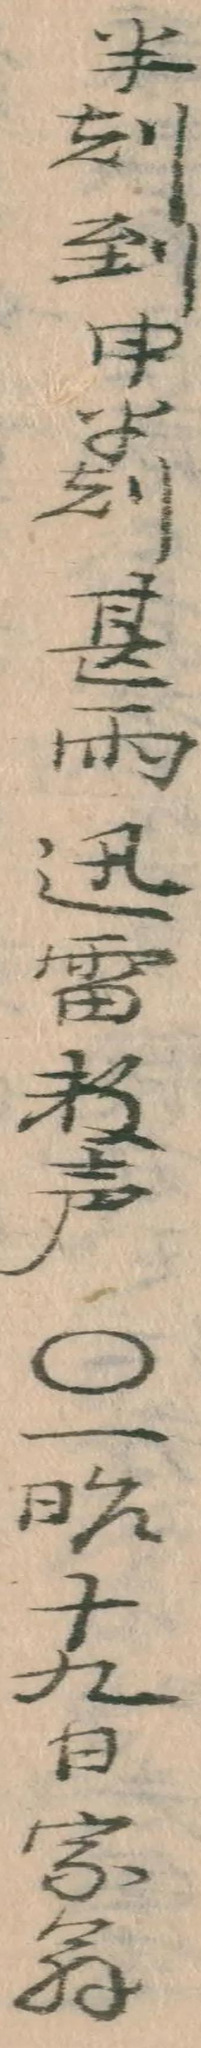半刻到申半刻甚雨雷数声○一昨十九日家翁
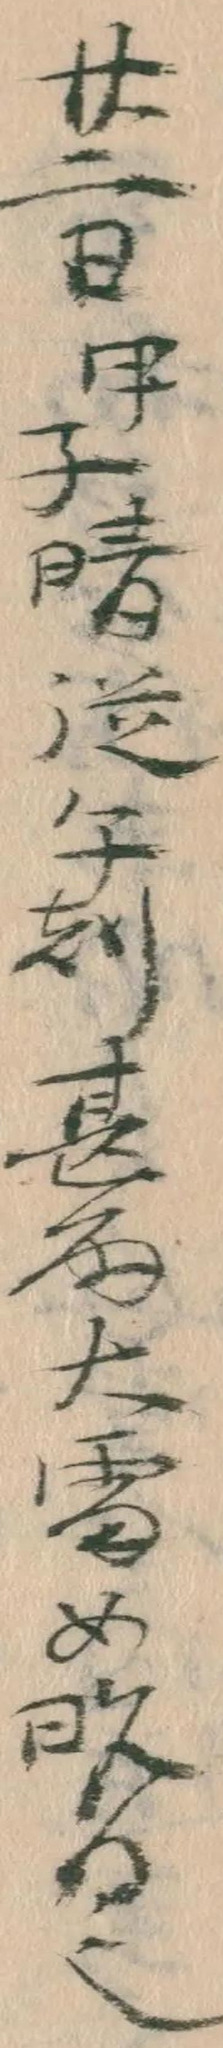廿二日甲子晴従午刻甚雨大雷如昨日也
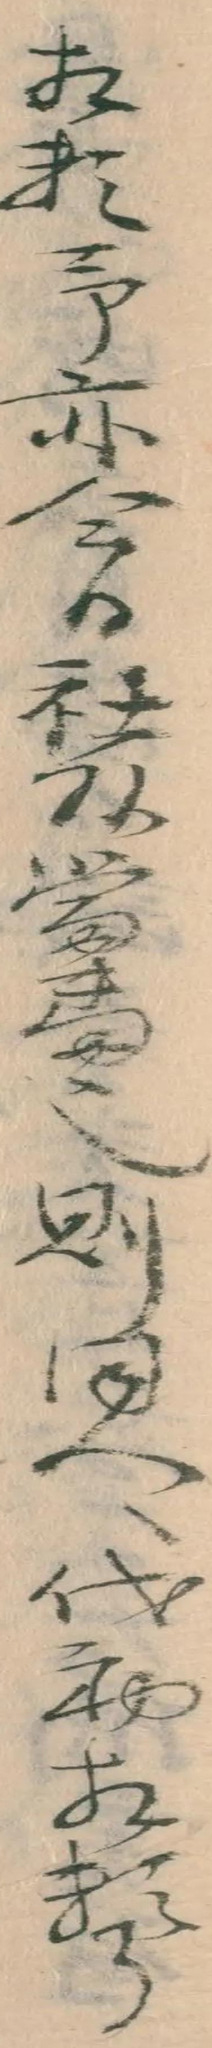相頼予亦今日社頭當番也則同人へ代勤相頼了
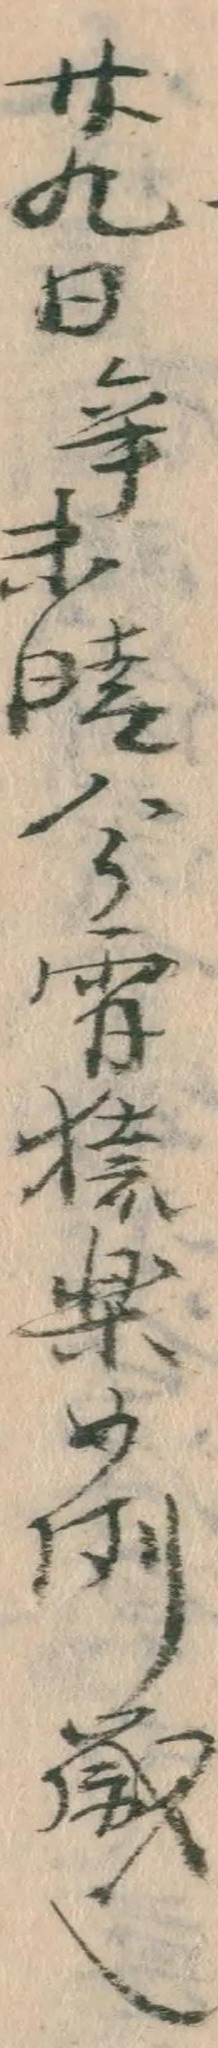廿九日辛未晴今宵猿楽如例歳也
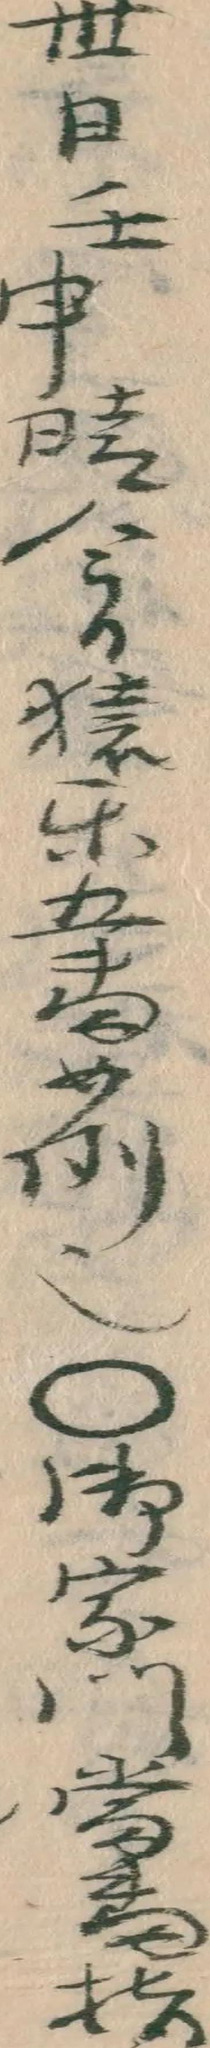卅日壬申晴今日猿楽五番如例也○御家門當番指
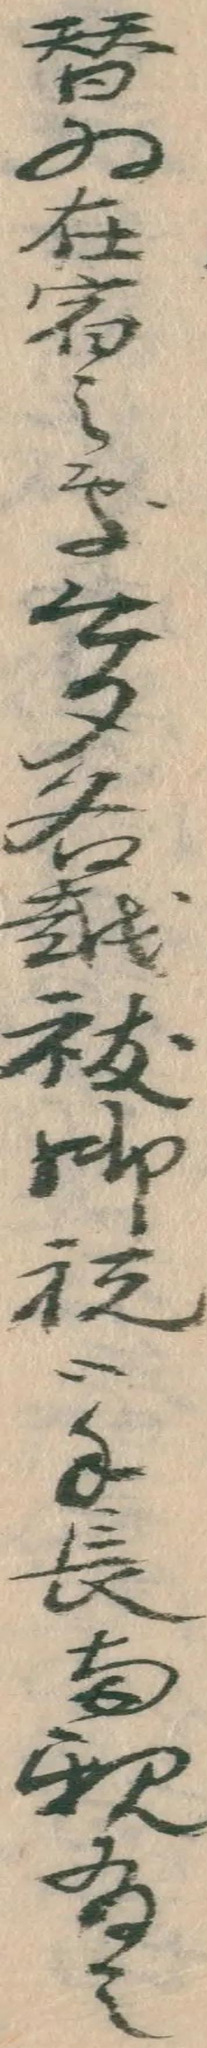替為在宿之處今夕名越祓御祝御手長両親有之
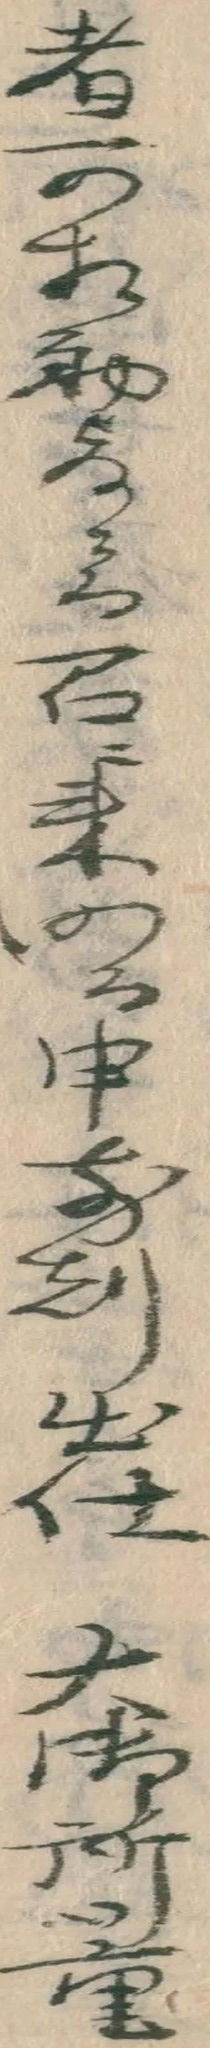者可相勤旨ニ而召ニ来回而申前刻出仕大御所御重
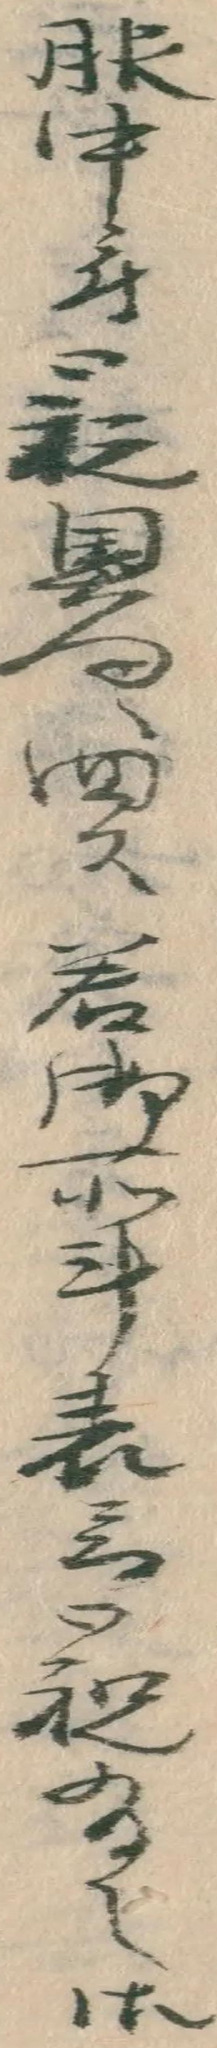服中ニ付御祝奥向ヘ回ス若御所計表ニ而御祝有之御
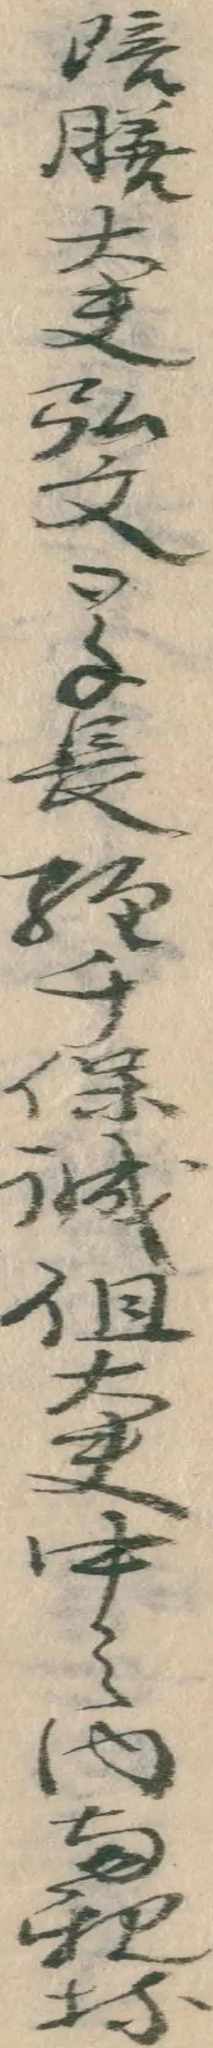陪膳大夫弘文御手長経千保誠但大夫中之内両親持
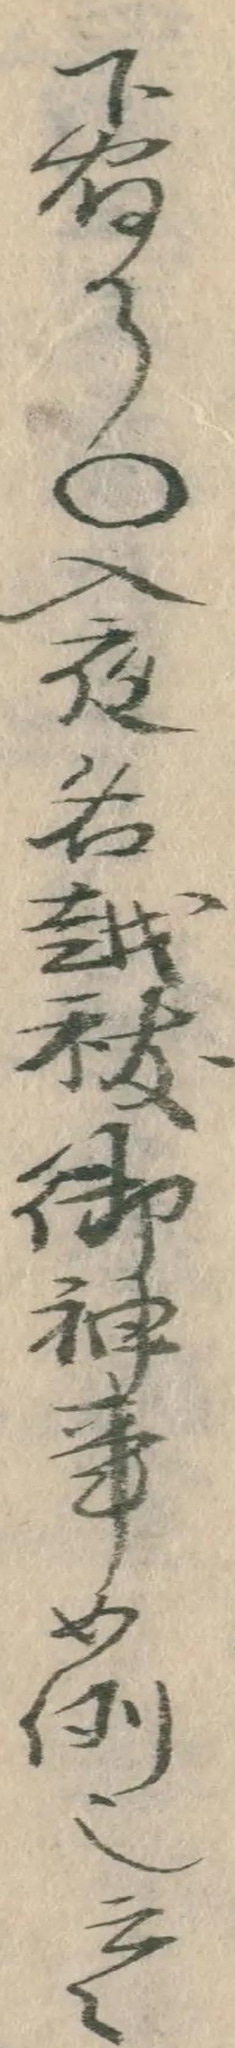下有了○入夜名越被御神事如例也云々
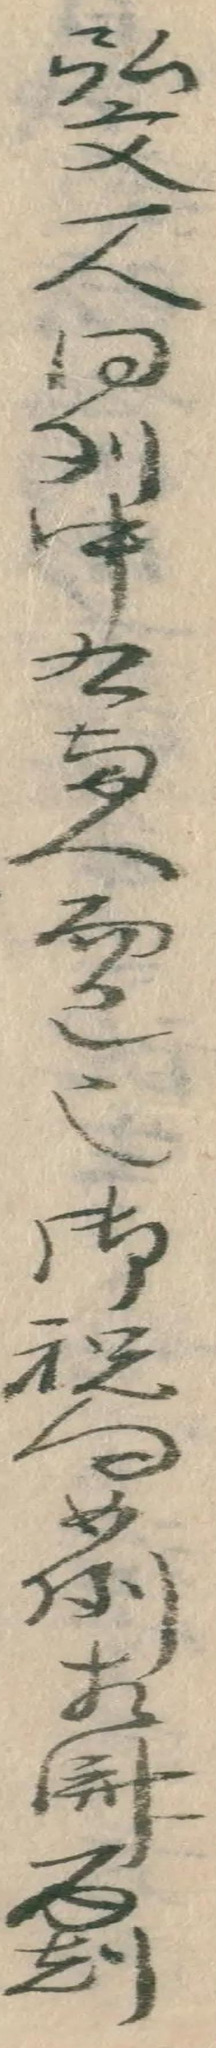弘文一人同州中右両人而已也御祝句如例相済酉刻
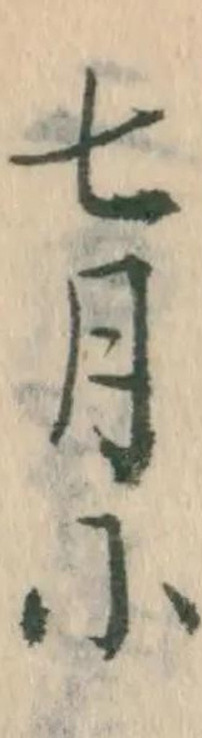七月小
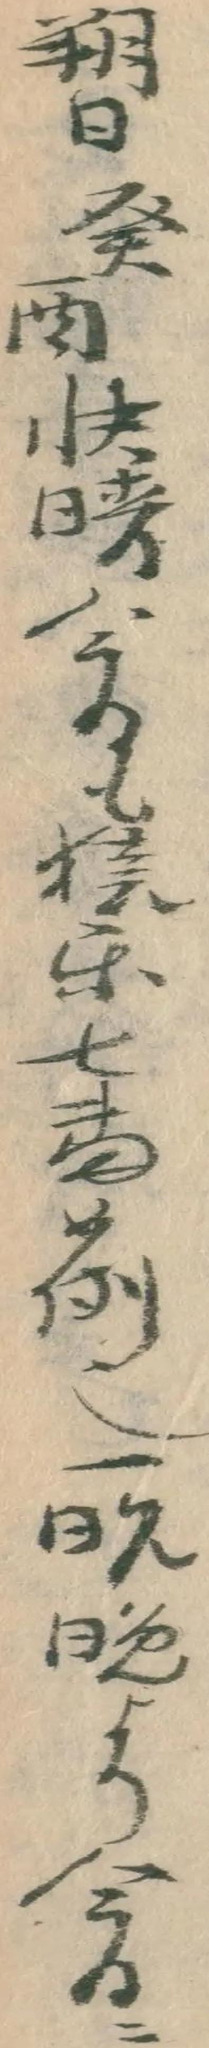朔日癸酉快晴今日も猿楽七番如例也一昨晩より今日ニ

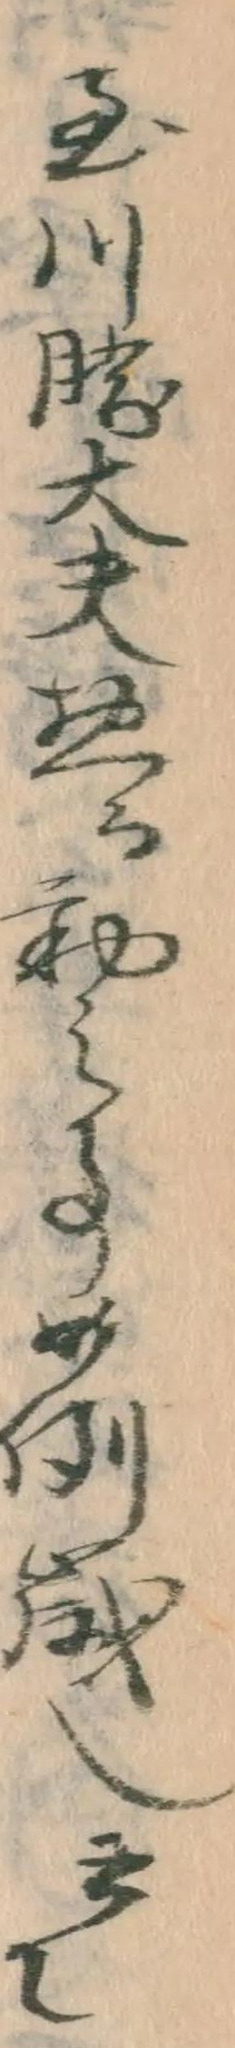至川勝大夫惣而勤之事如例歳也云々
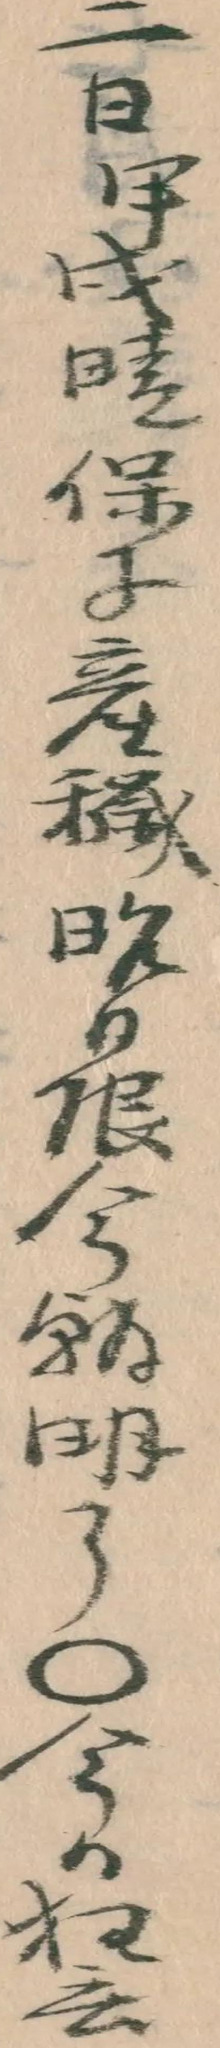二日甲戌晴保子産穢昨日限今朝明了○今日狂言
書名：賀茂社記録. 第63冊
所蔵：国立国会図書館 National Diet Library, JAPAN
